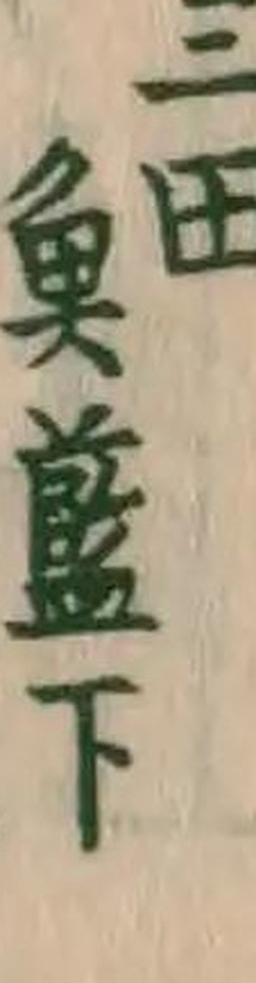魚籃下
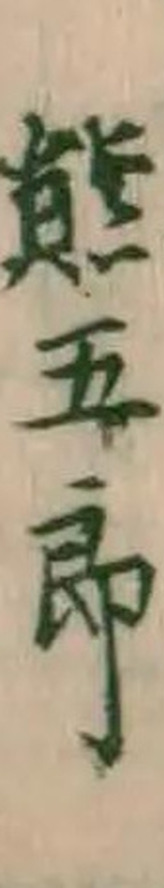熊五郎
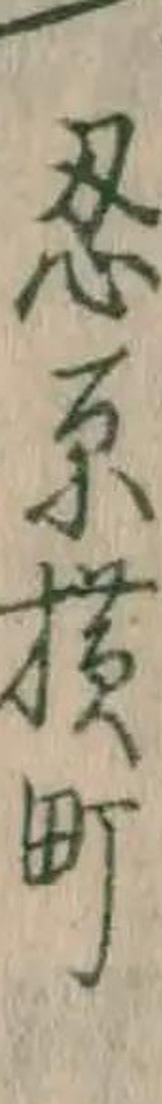忍原横町
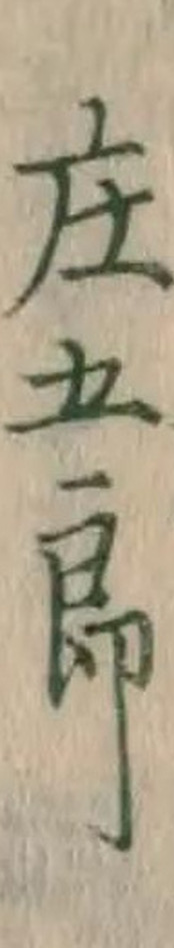熊五郎
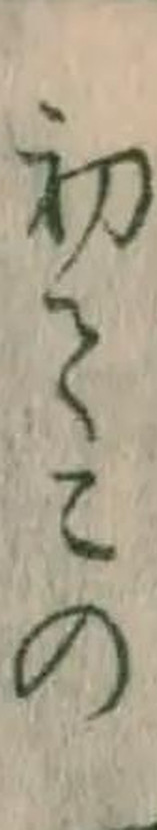初てこの
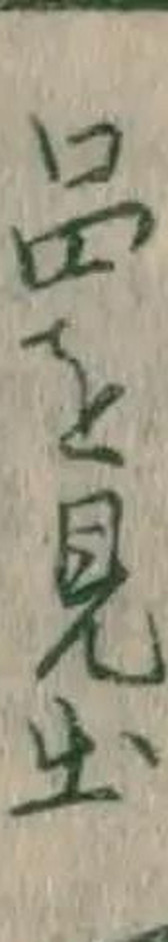品を見出
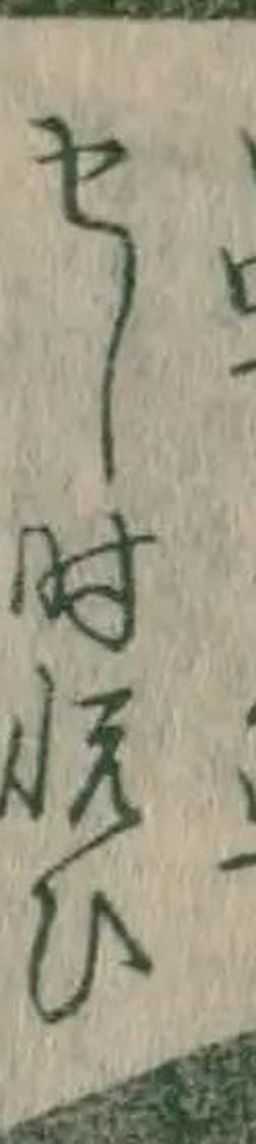せし時悦ひ
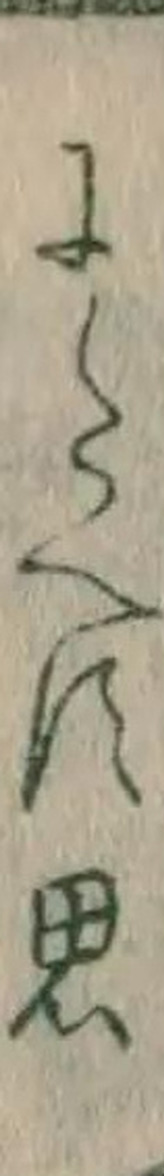にたへす思
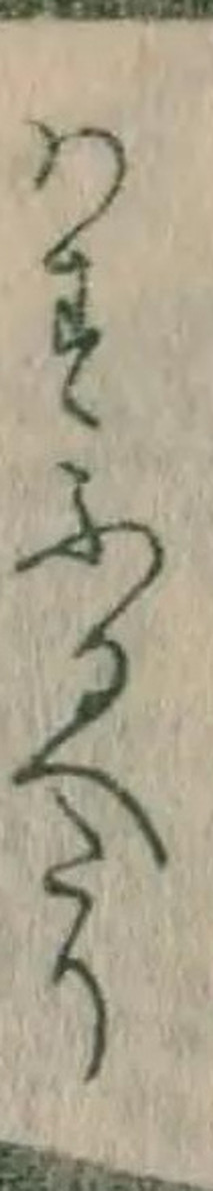はすふるへたり
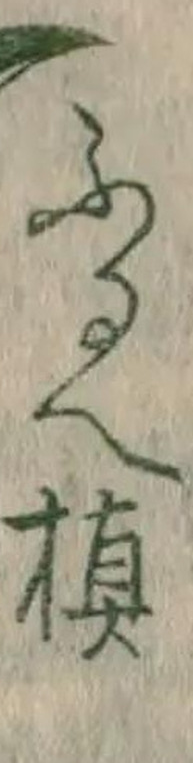ふるへ槙
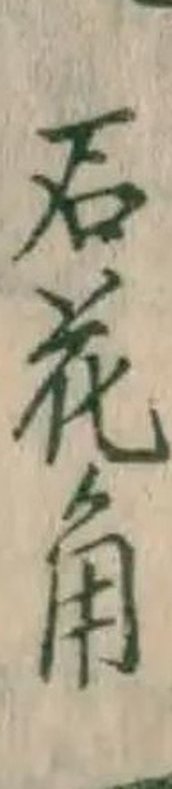石花角
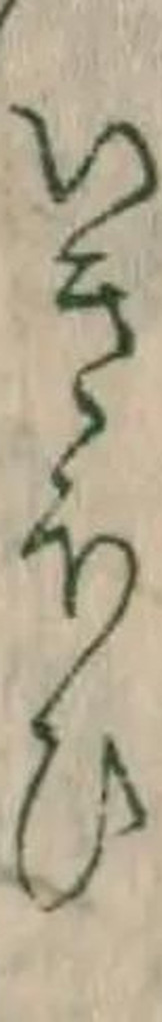いきほひ
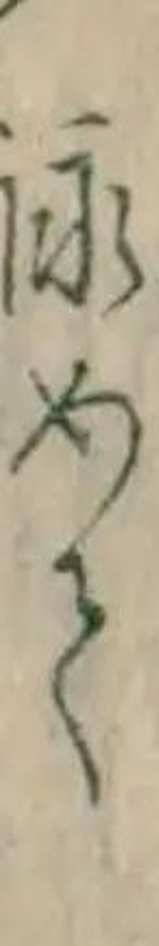詠めて
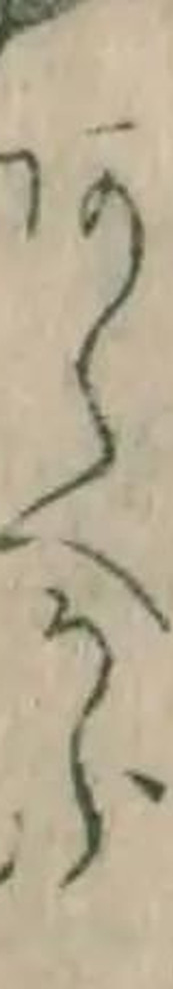あくへから
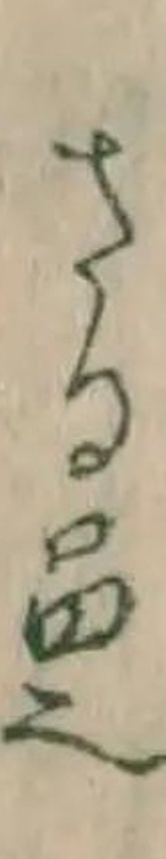さる品也
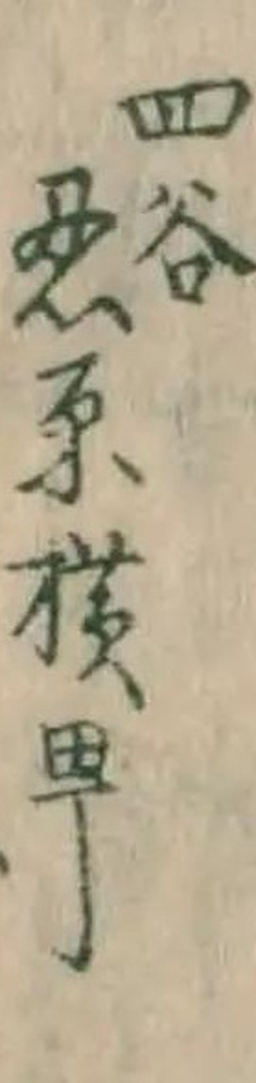忍原横町
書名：草木奇品家雅見 3巻. [3]
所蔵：国立国会図書館 National Diet Library, JAPAN
